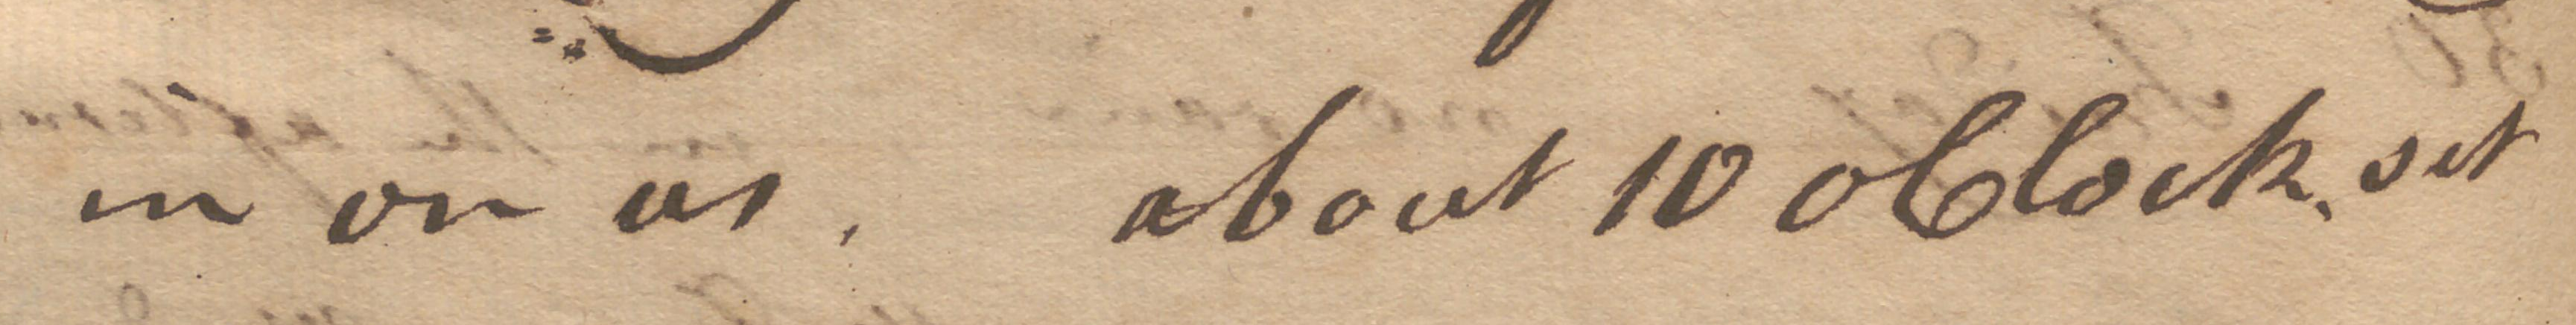in on us, about 10 oClock set
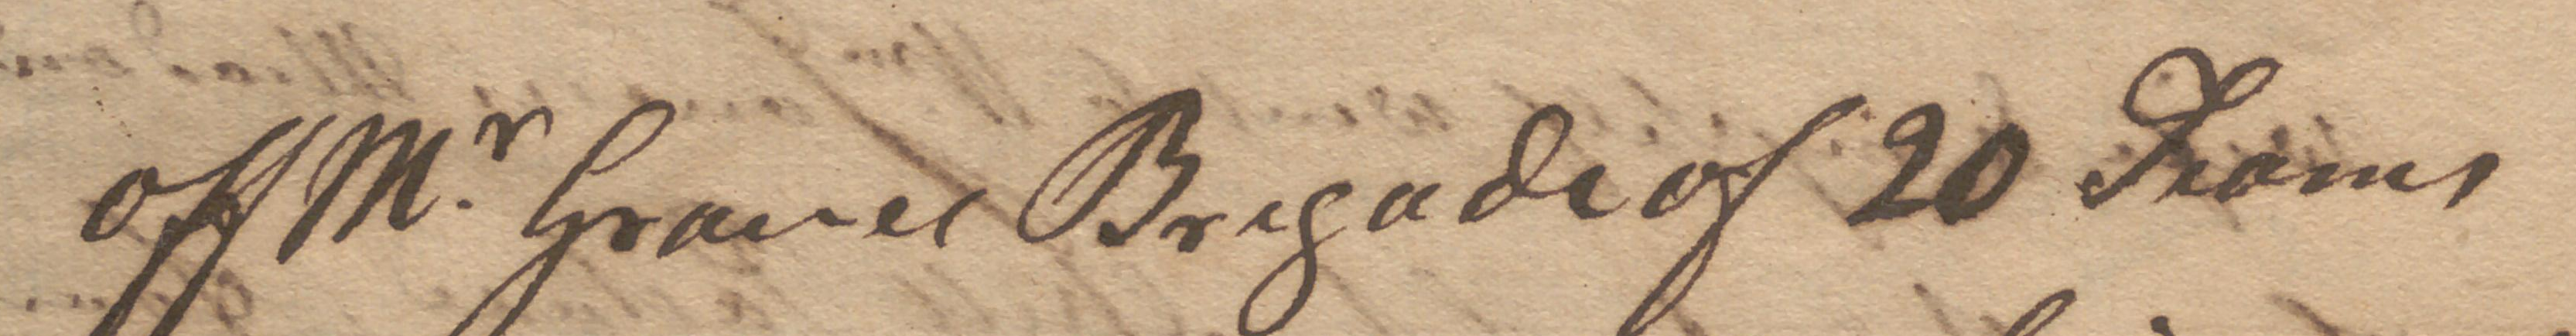off M^r. Graves Brigade of 20 Teams
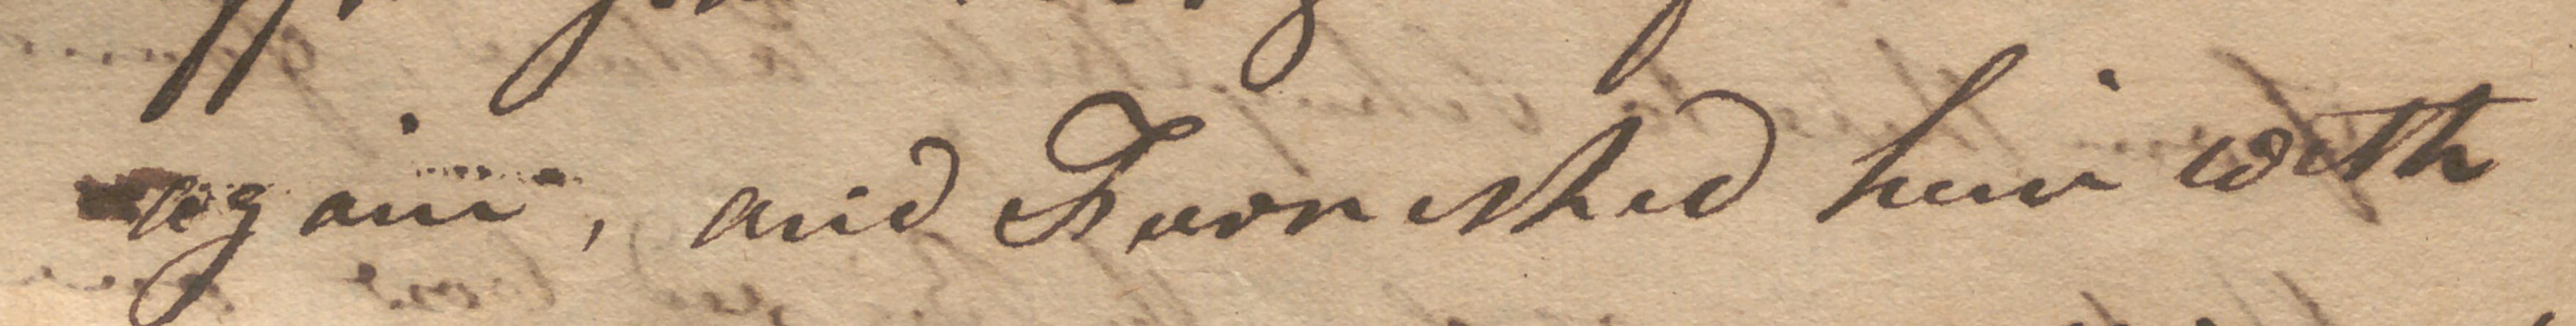again, and Furnished him with
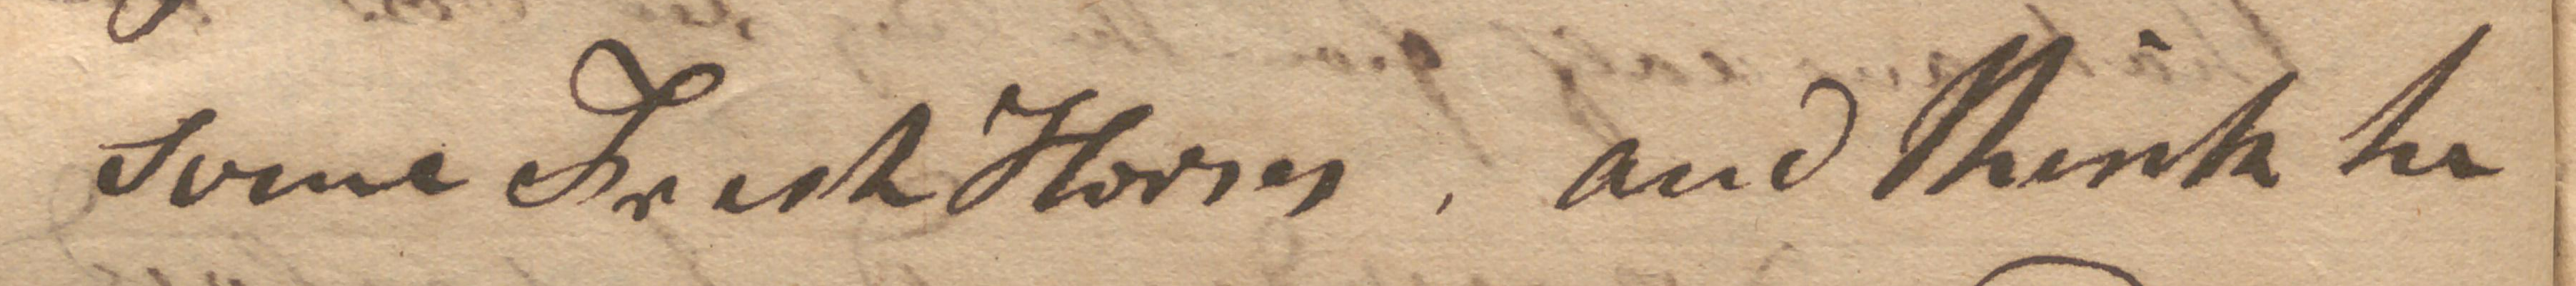some Fresh Horses, and think he
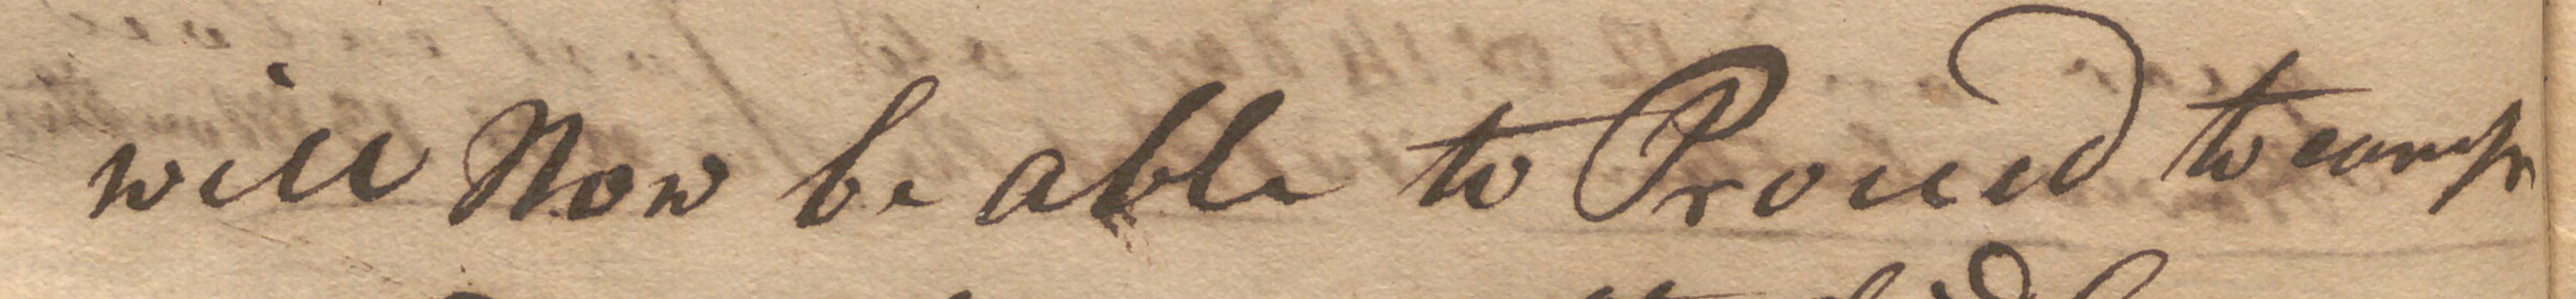will now be able to Proceed to camp
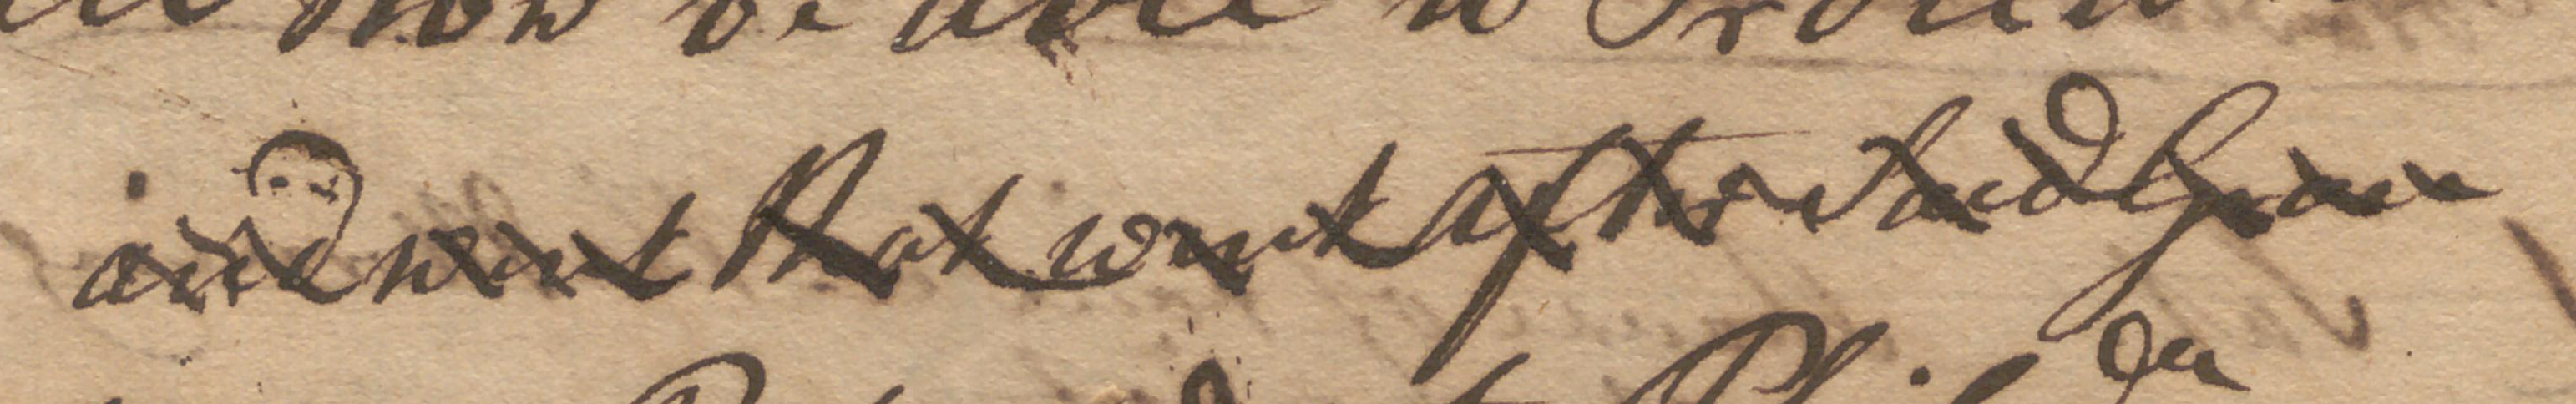[and went that went after said Grave]
